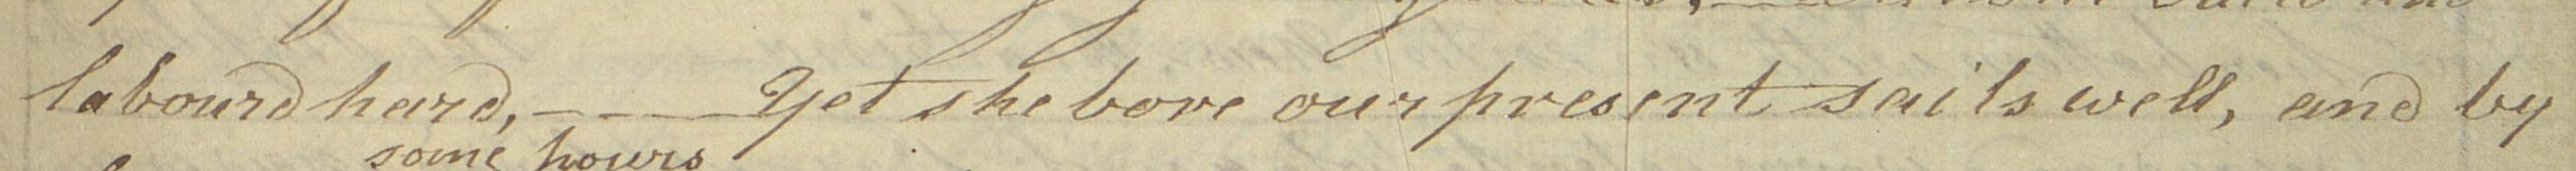labourd hard, Yet she bore our present sails well, and by
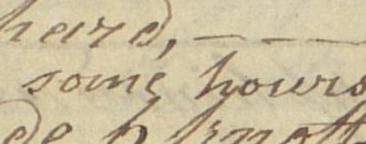some hours
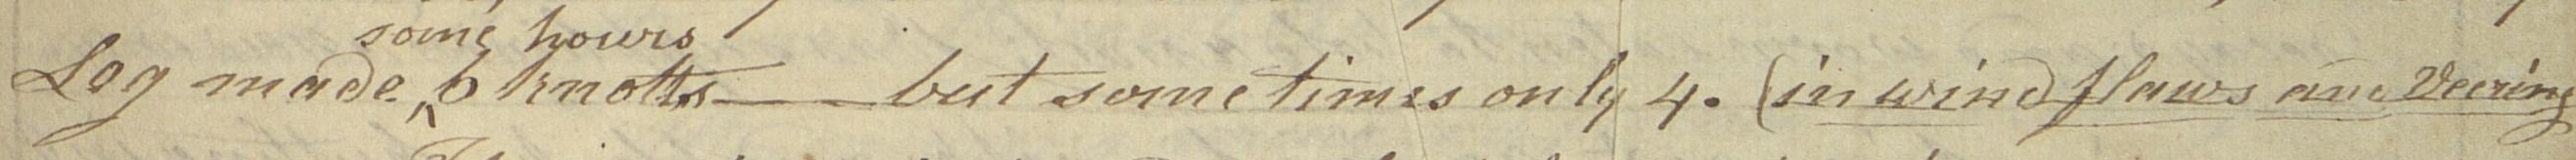Log made ^ 6 knotts, but sometimes only 4. (in wind flaws are Veering
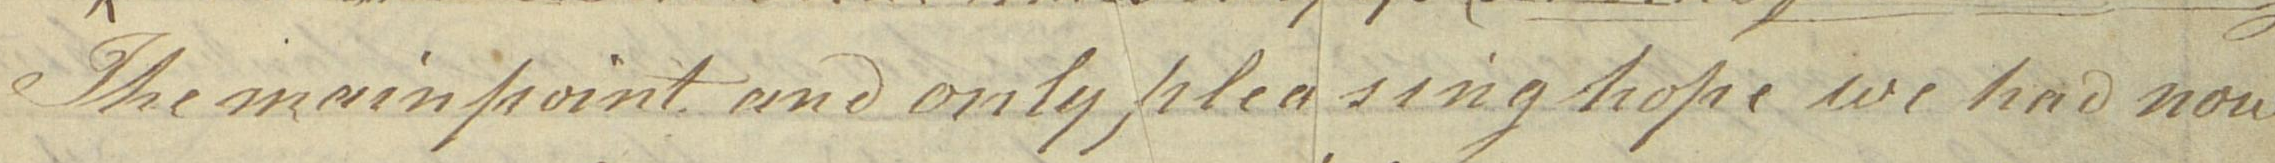The main point and only pleasing hope we had now
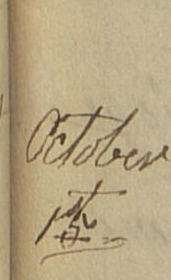October
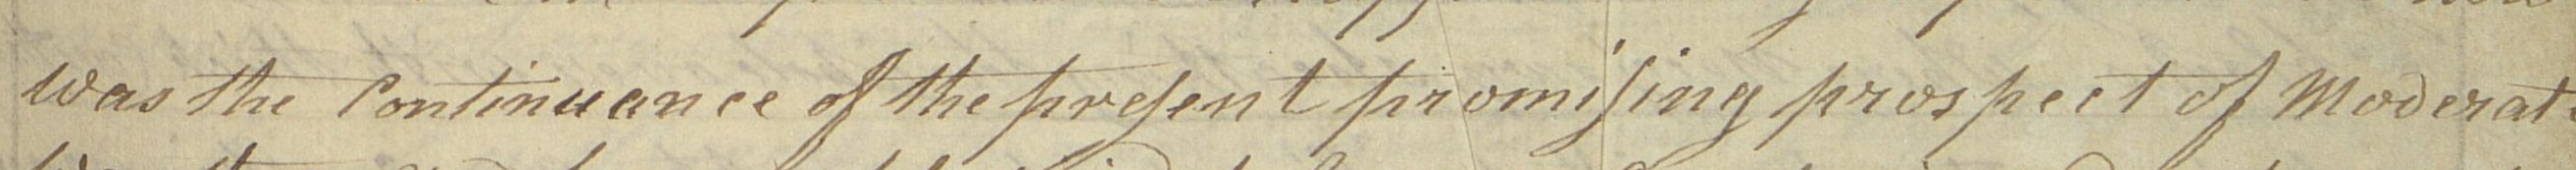was the continuance of the present promising prospect of Moderate
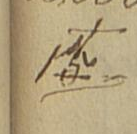15^th
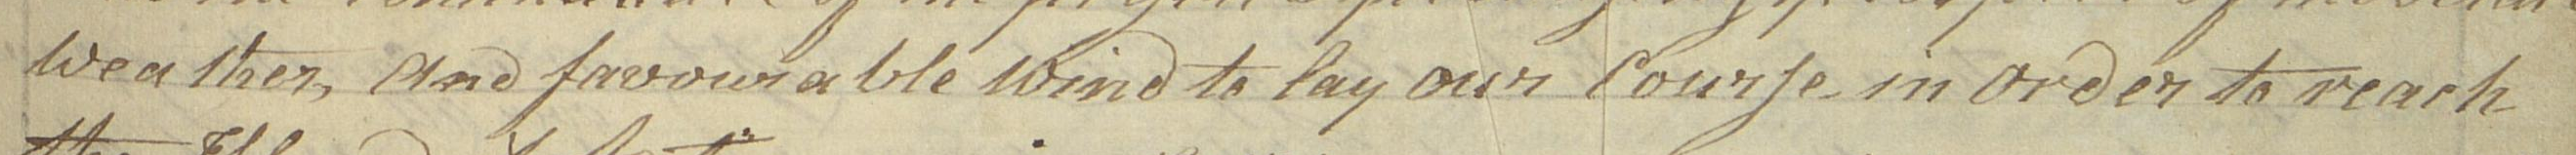Weather, and favourable Wind to lay our Course in order to reach
